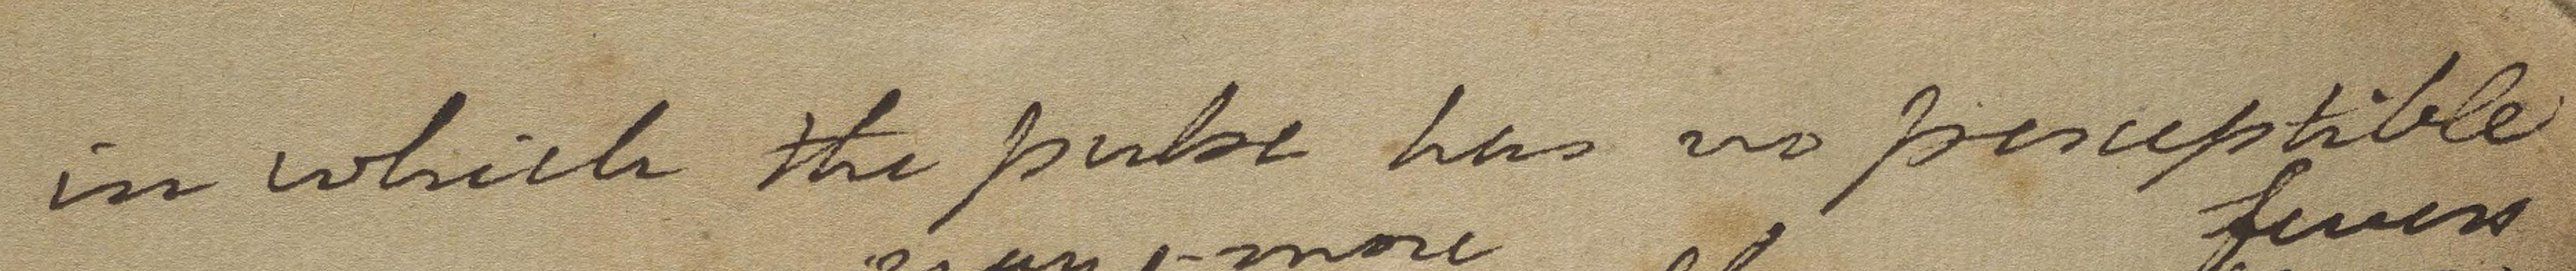in which the pulse has no perceptible
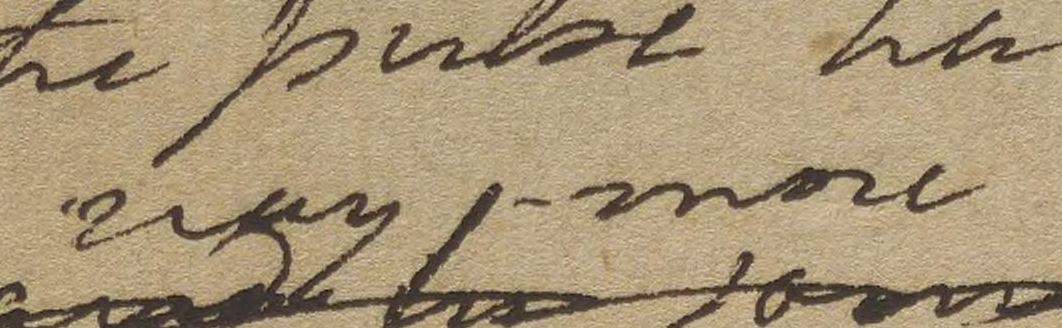way more
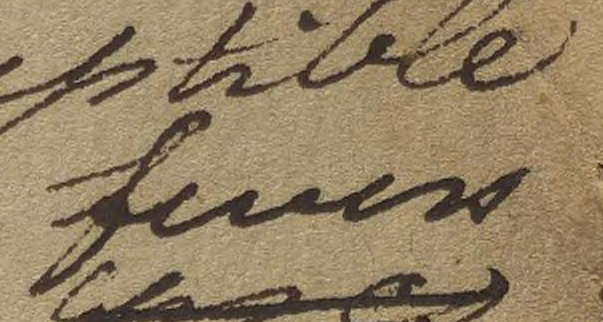fevers
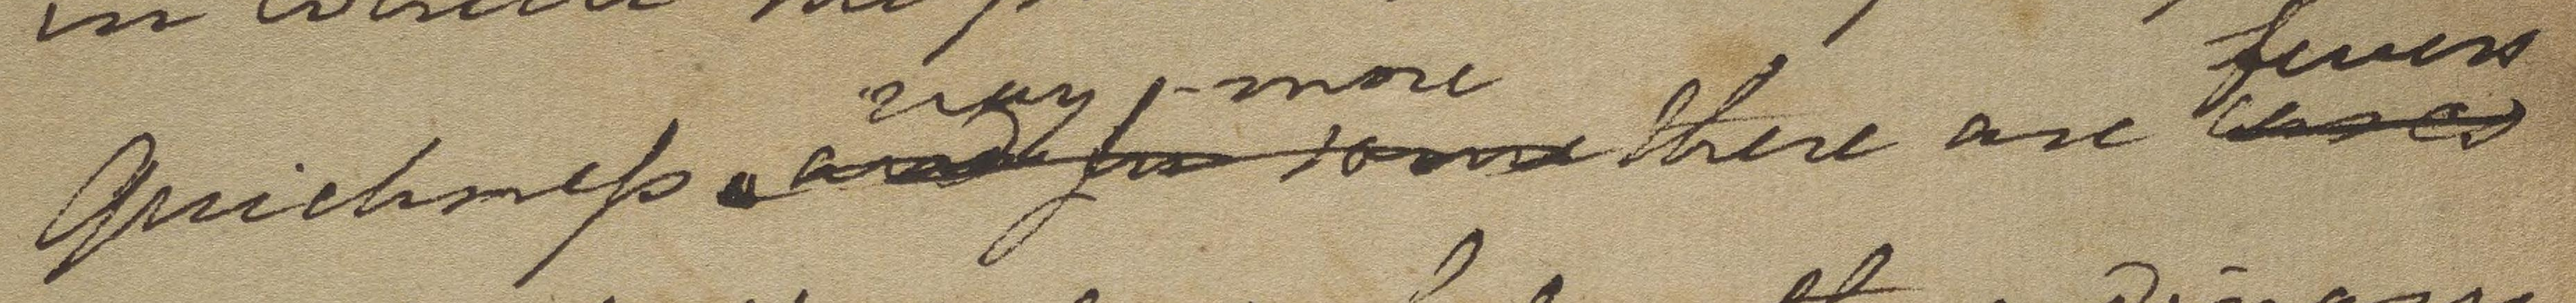quickness, [and for some] there are [cases]
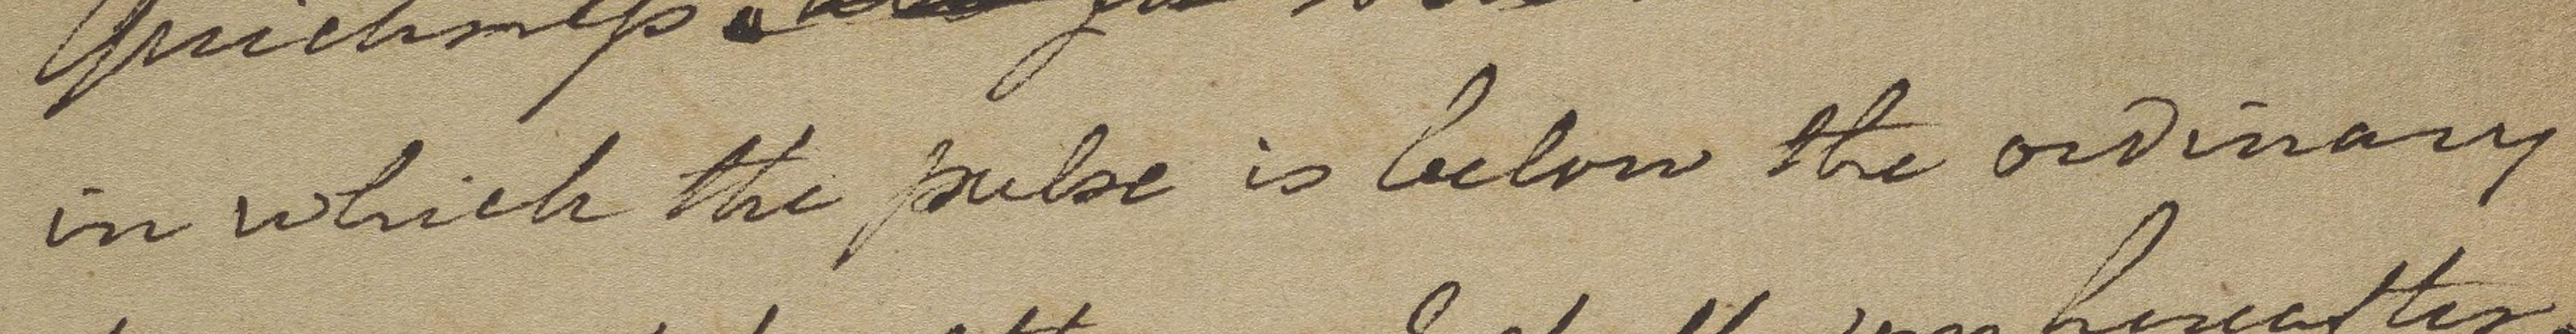in which the pulse is below the ordinary
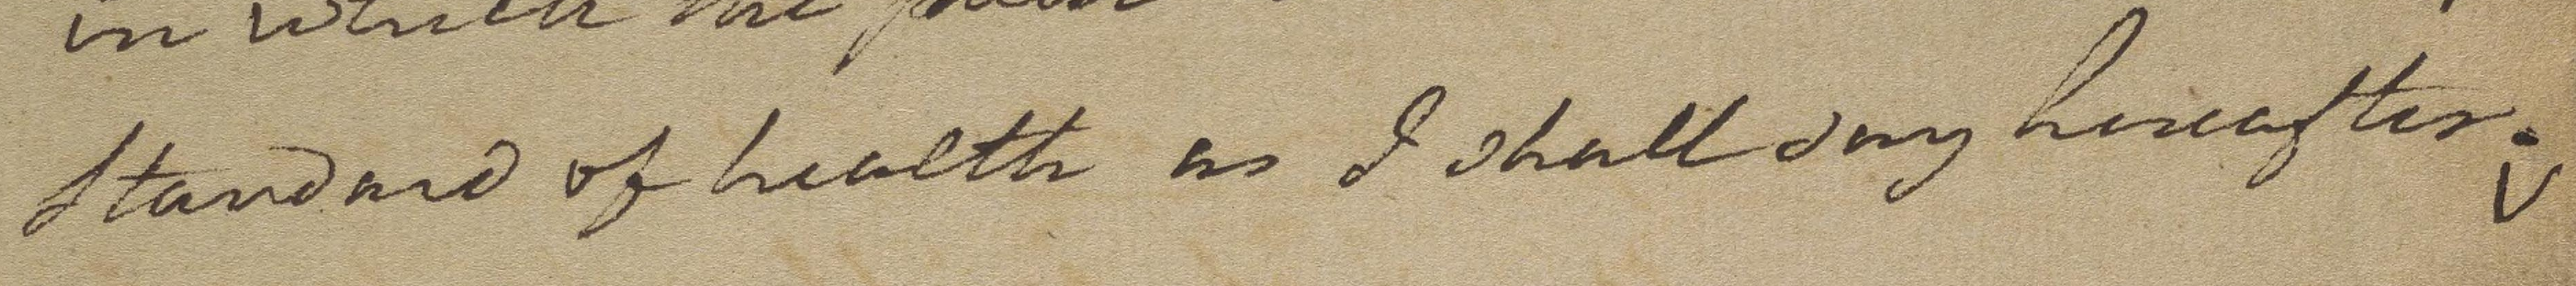standard of health as I shall say hereafter.
